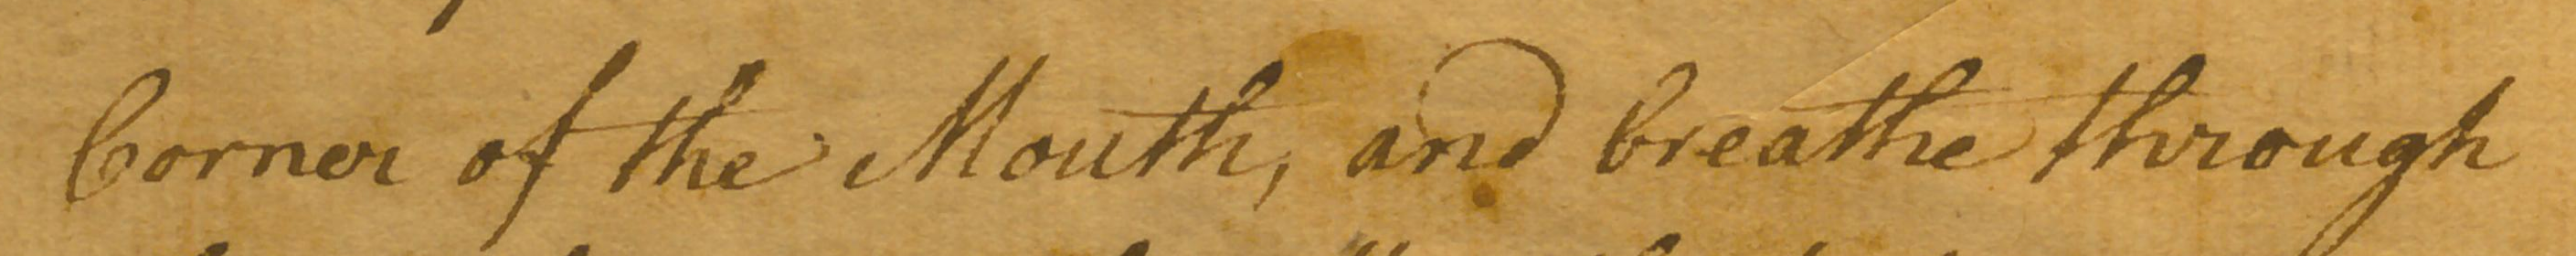Corner of the Mouth, and breathe through
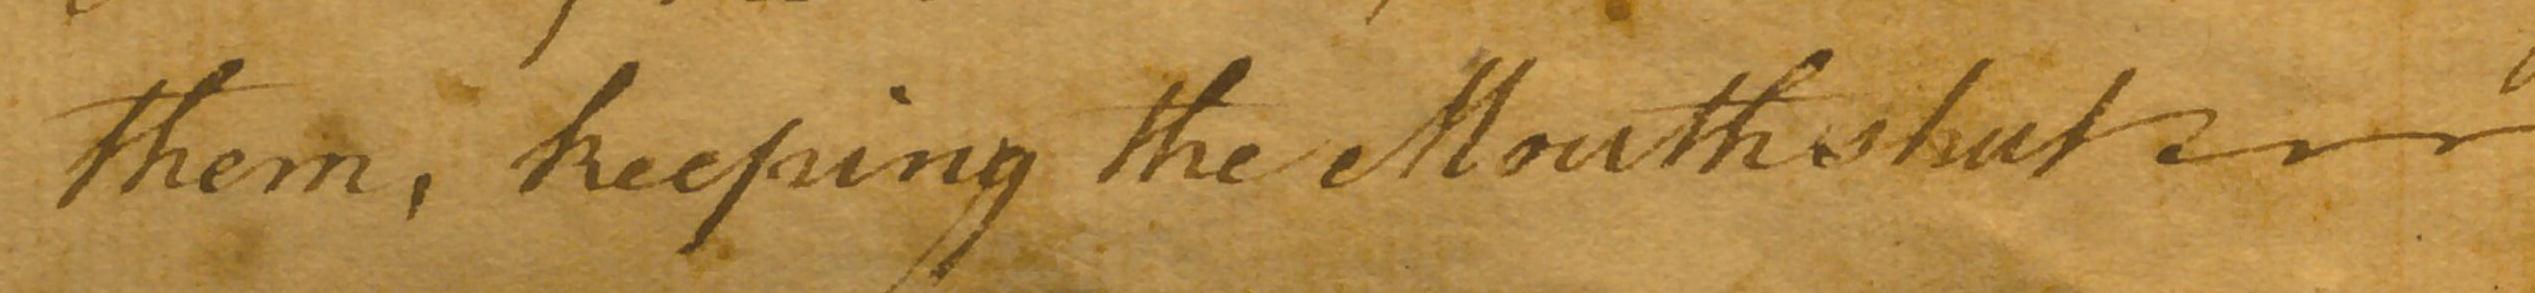them, keeping the Mouth shut-
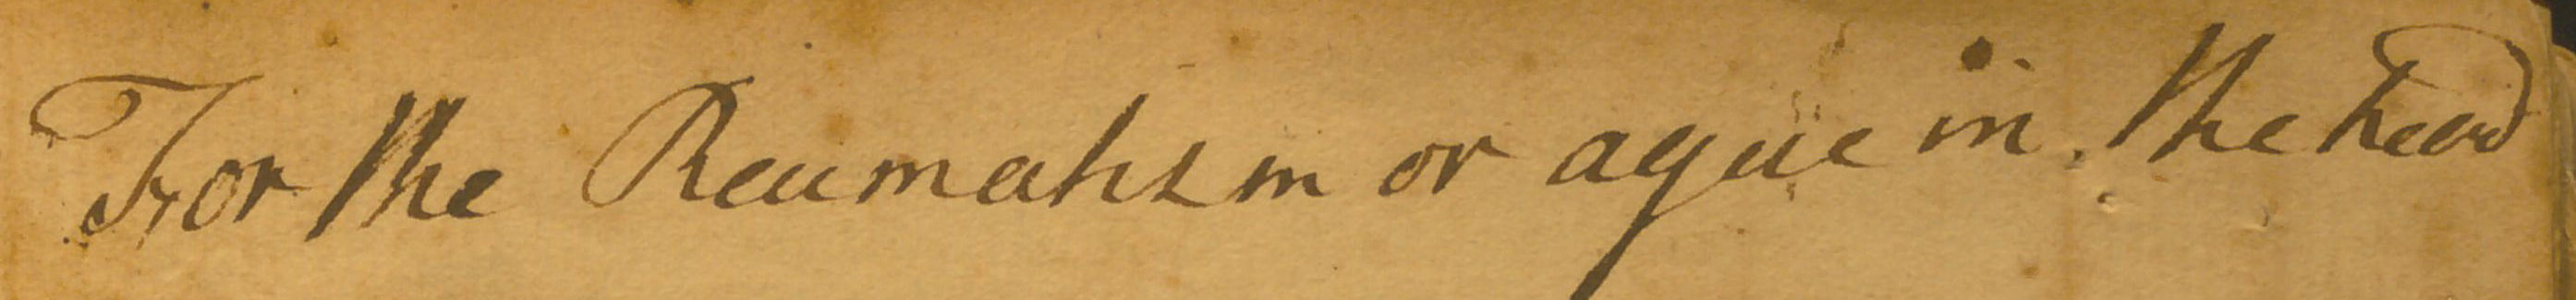For the Reumatism or ague in the head
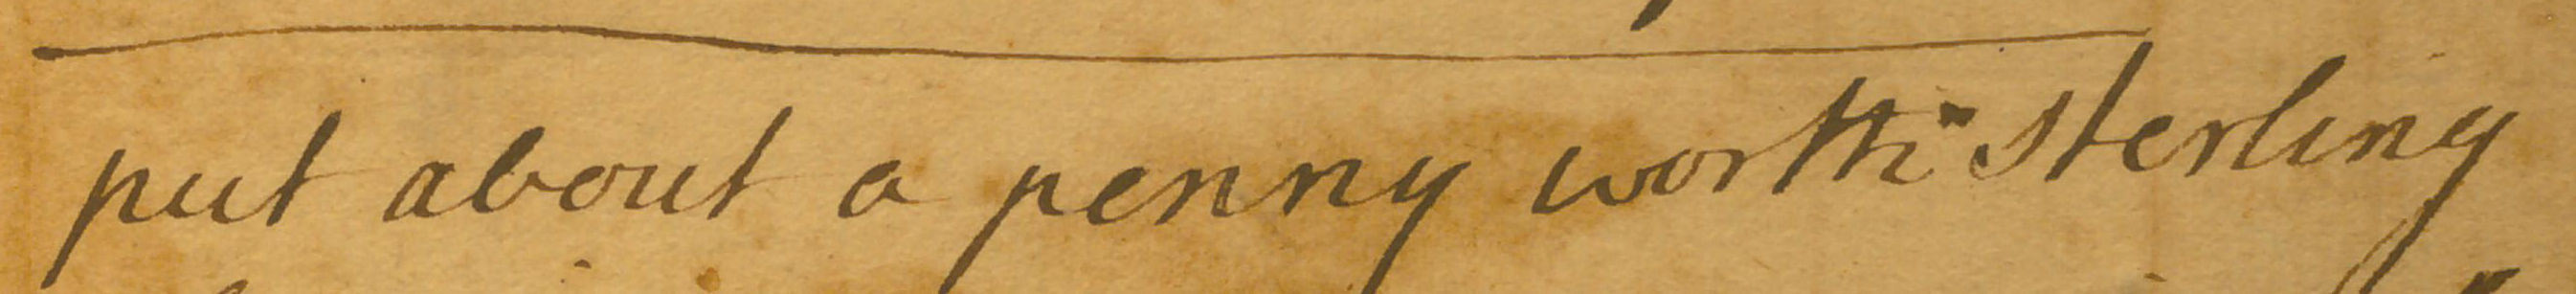put about a penny worth sterling
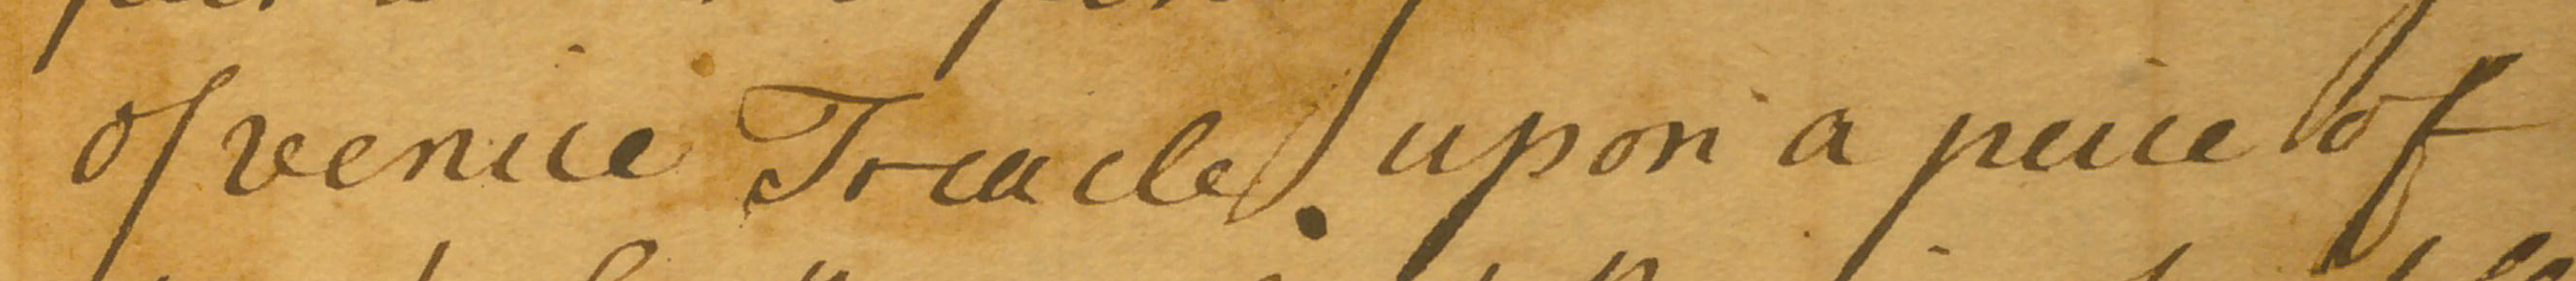of veince Treacle upon a peice of
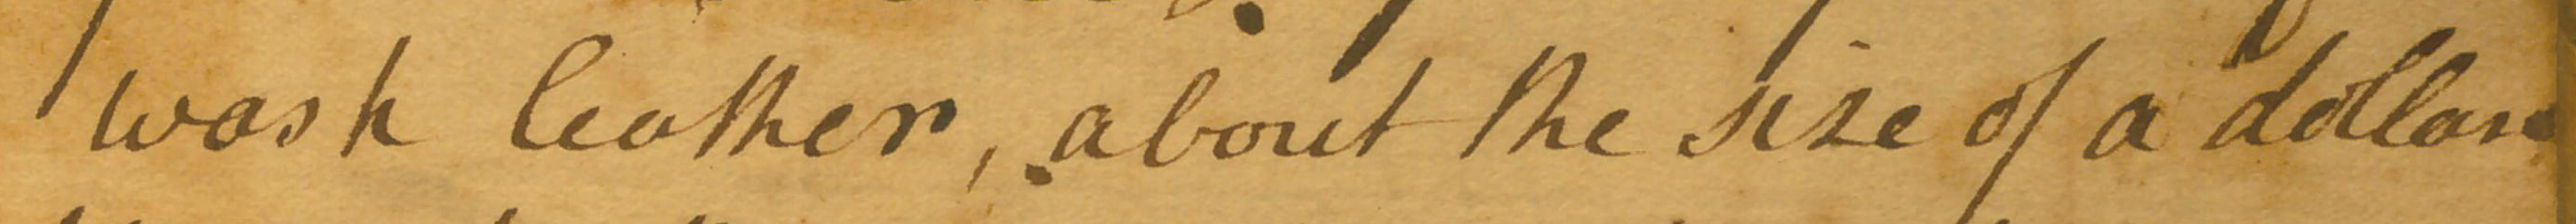wash leather, about the size of a dollar
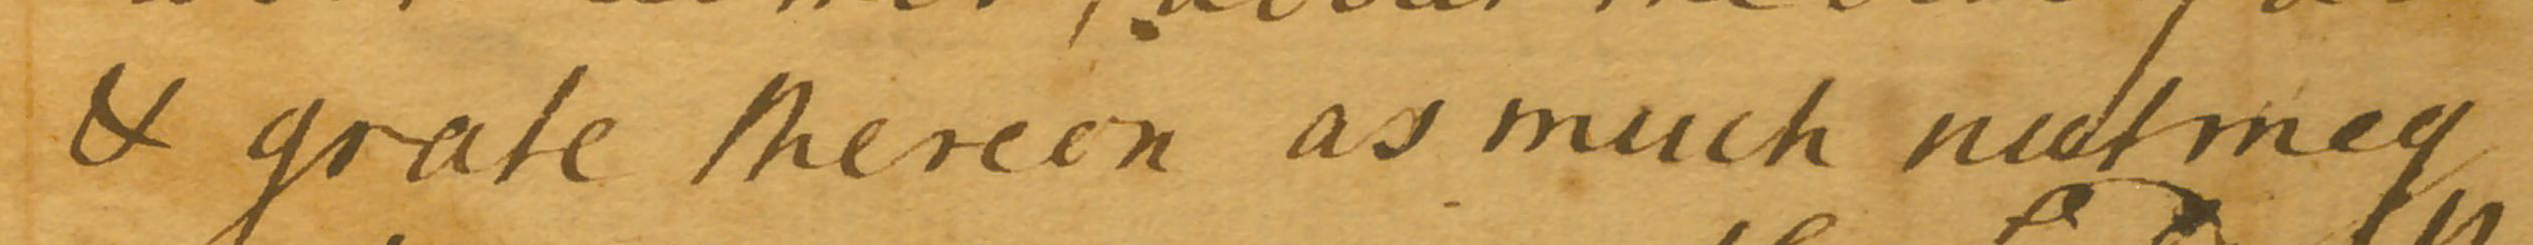& grate thereon as much nutmeg
